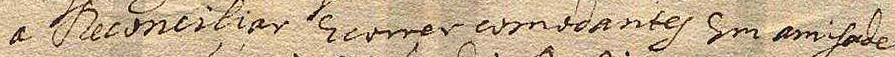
a Reconciliar E correr como dantes Em amisade
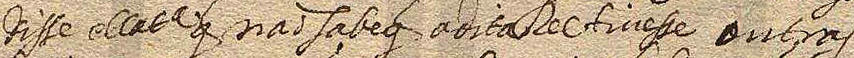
disse ella ta q̄ naõ sabe q̄ a dita Ree tiuesse outras
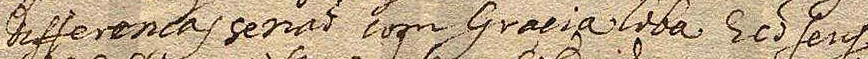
differenças senaõ com Graçia loba E cō seus
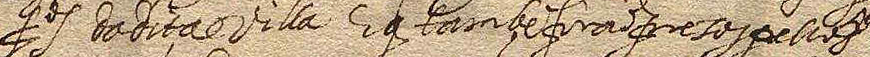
fos da dita e villa E q̄ tambē foraõ prezos pello sto
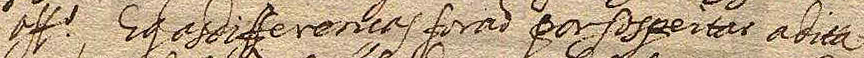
offo., E q̄ as differenças foraõ por sospeitas a dita
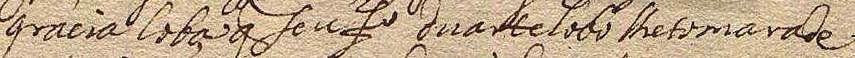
graçia loba q̄ seu fo duarte lobo lhe tomara de
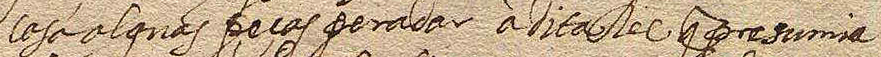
casa alguās peças pera dar à dita Ree q̄ presumia
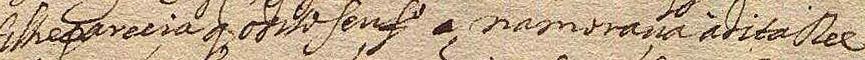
E lhe pareçia q̄ o dito seu fo a namoraua à dita Ree
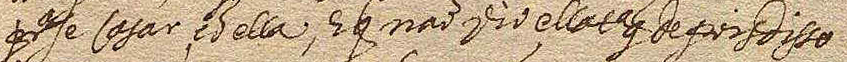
pra se casar cō ella, E q̄ naõ vio ella ta q̄ depois disso
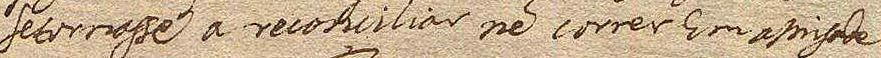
se tornassē a reconçiliar nē correr Em amisade
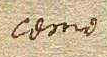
como
